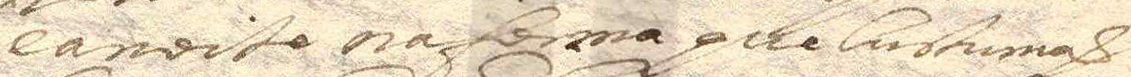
e a noite na forma que Custumaõ
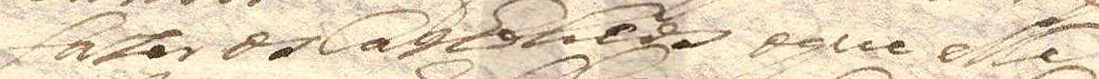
fazer os Catholicos o que elle
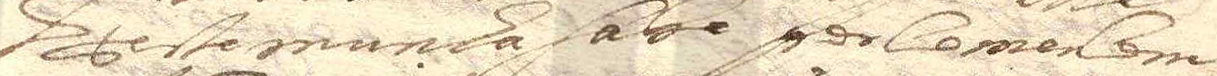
testemunha sabe por Comer Com
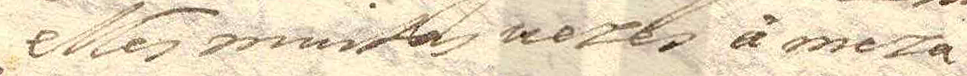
elles muitas uezes á meza
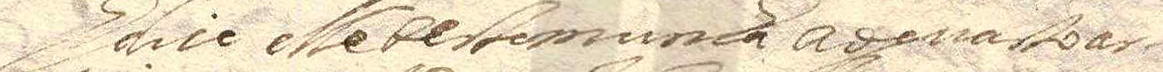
E dice elle testemunha ao quarto ar
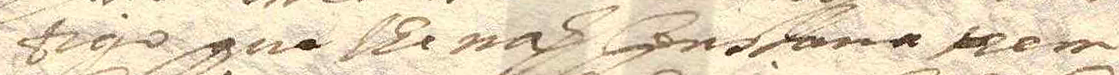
tigo que lhe não constava nem
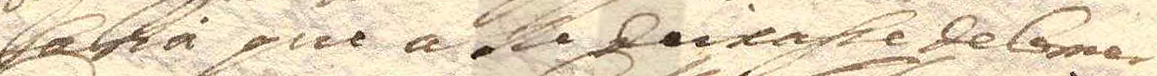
sabia que a Re deixasse de Comer
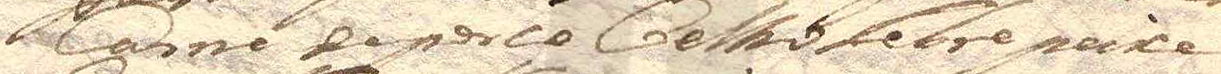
Carne de porco Coelho Lebre peixe
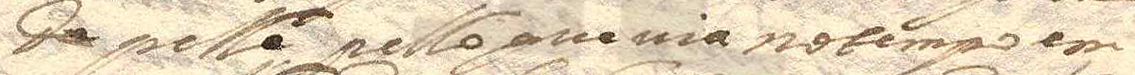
de pelle pello que via no tempo em
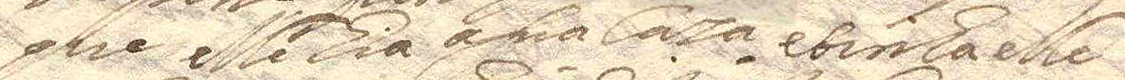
que elle hia a Sua Caza e tinha elle
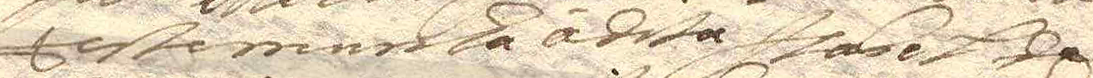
testemunha á dita Izabel de
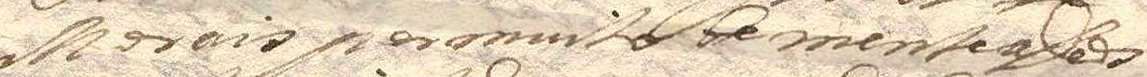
Morais por muito temente a Deos
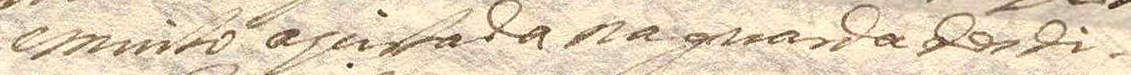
e muiti ajustada na guarda dos di
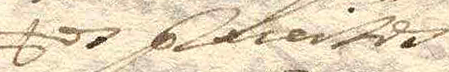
tos pReceitos
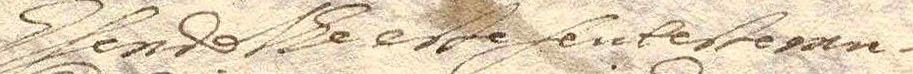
E Sendo lhe este seu testemu
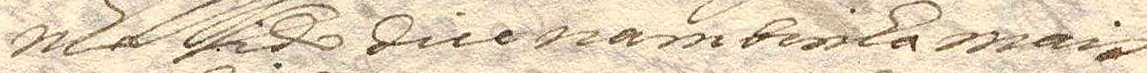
nho lido dice nam tinha mais
